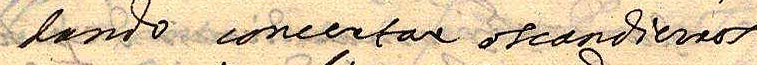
dando concertar os candieiros
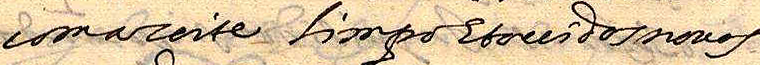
com azeite limpo E torcidas nouas
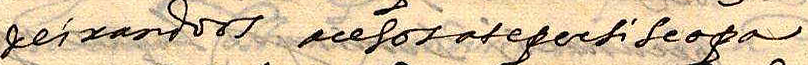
deixandoos acesos ate per si se apa
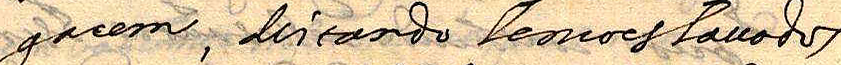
garem, deitando lencoes lauados
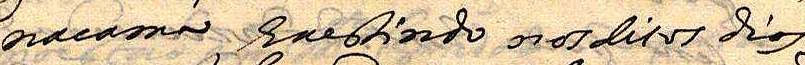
na cama E uestindo nos ditos dias
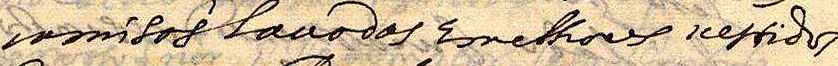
camisas lauadas E melhores uestidos
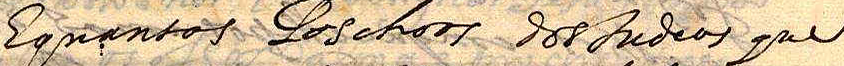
E quantas Paschoas dos Iudeos que
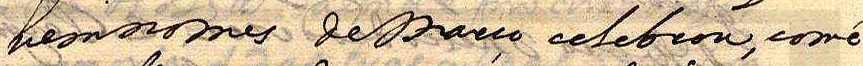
uem no mes de Março celebrou, comē
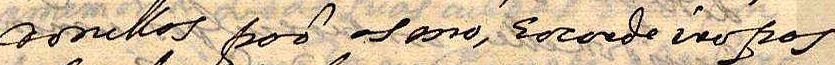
do nellas paõ asmo, e o cordeiro pas
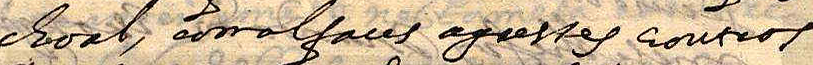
choal, com alfaces agrestes, E outras
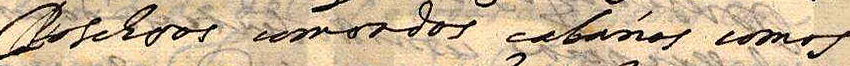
Paschoas como a das cabanas com as
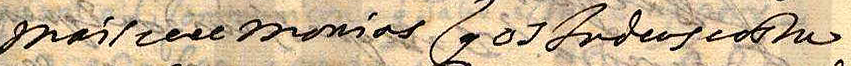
mais ceremonias q̄ os Iudeos costu
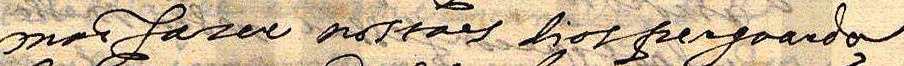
maõ fazer nos taes dias per goarda
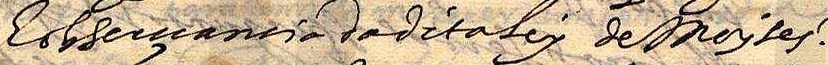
E obseruancia da dita Ley de Moyses?
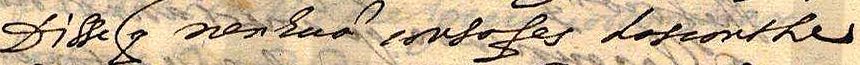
Disse q̄ nenhuā cousa fes das conthe
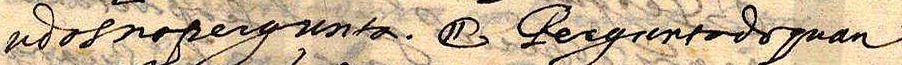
udas na pergunta. ¶ Perguntado quan
